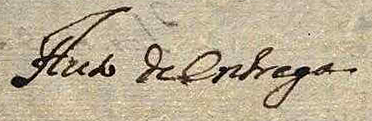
Auto de entrega
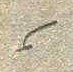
6
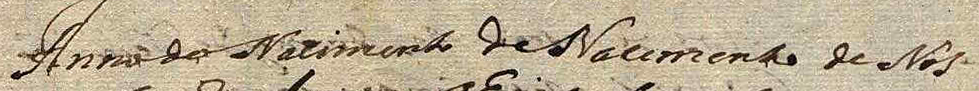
Anno do Nacimento de Nacimento de Nos
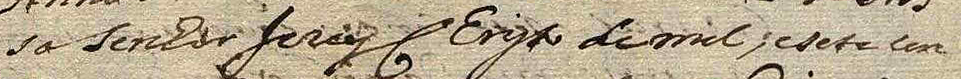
so senhor Jezus Christo de mil, e setecen
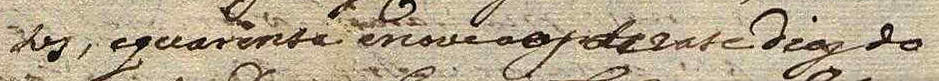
tos, e quarenta e nove aos dezate dias do
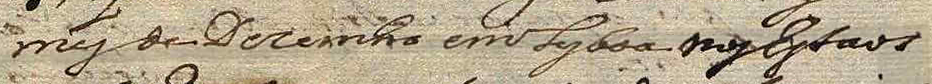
mes de Dezembro em Lisboa nos Estaos
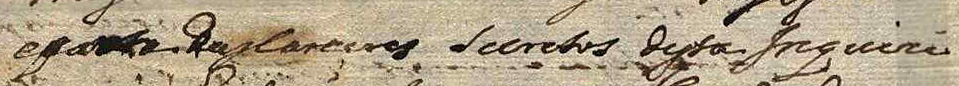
e parte dos carceres secretos desta Jnquizi
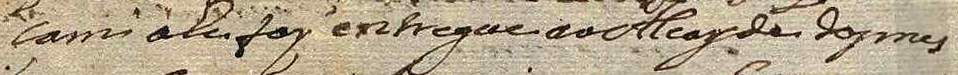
çam ahi foy entregue ao Alcayde dos mes
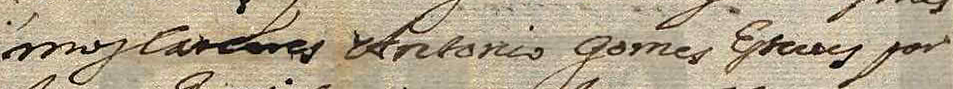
mos carceres Antonio Gomes Esteues por
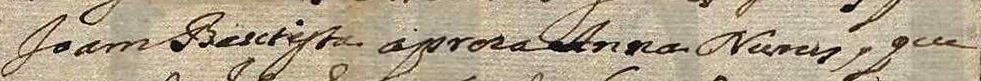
Joam Bautista a preza Anna Nunes, que
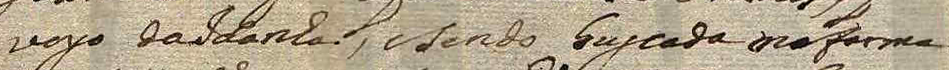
veyo da Idanha; e sendo buscada na forma
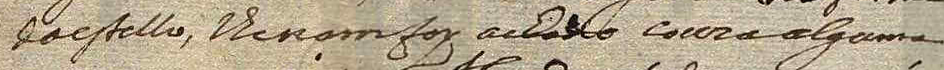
do estello, lhe nam foy achado couza alguma
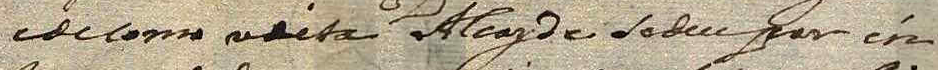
e de como o dito Alcayde se deu por en
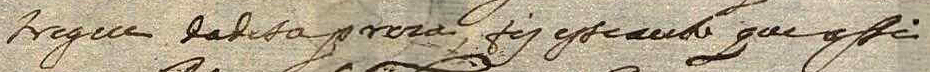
tregue da dita preza, fis este auto que assi
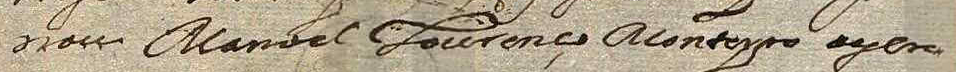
nou Manoel Lourenço Monteyro o escre
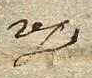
vj
